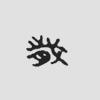歲
